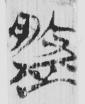盤
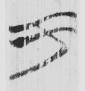于
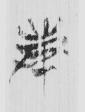庚
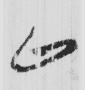㠯（以）
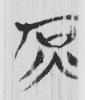庶
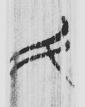民
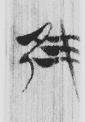隹
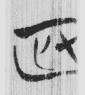政
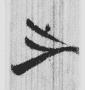之
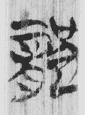{龍兄}
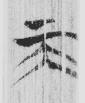天
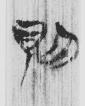則
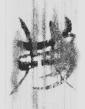弗
